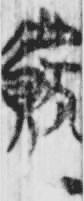宋
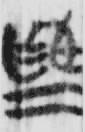爲
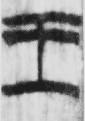王
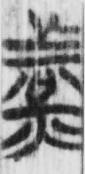煮
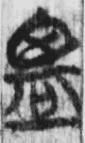○（鹽）
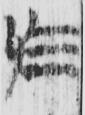於
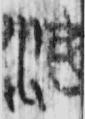○（海）
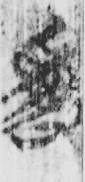受
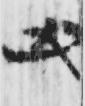屯
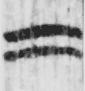二
